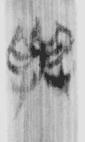與
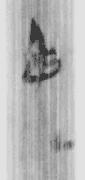身
